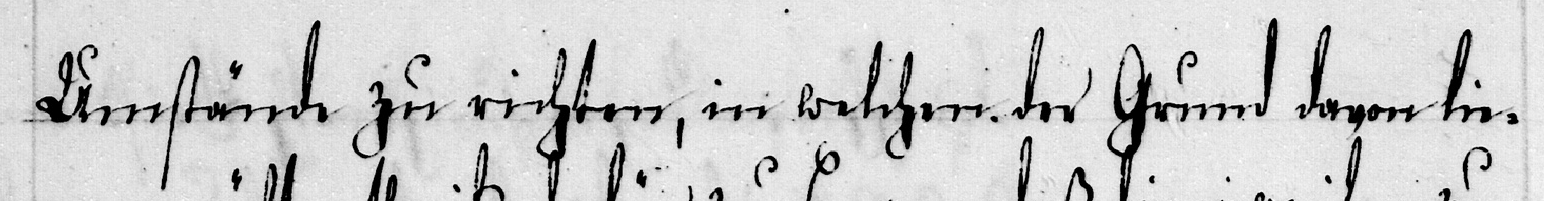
Umstände zu richten, in welchen der Grund davon lie¬
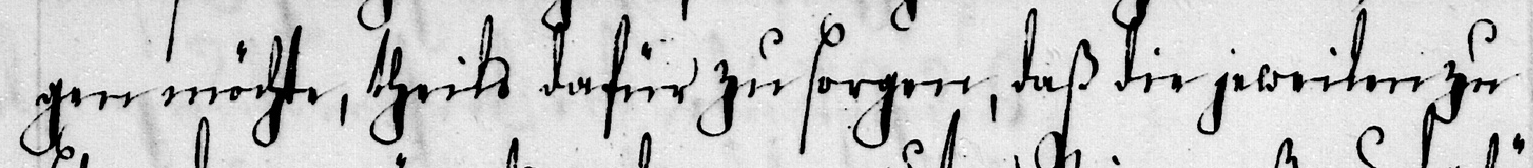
gen möchte, theils dafür zu sorgen, daß die jeweilen zu
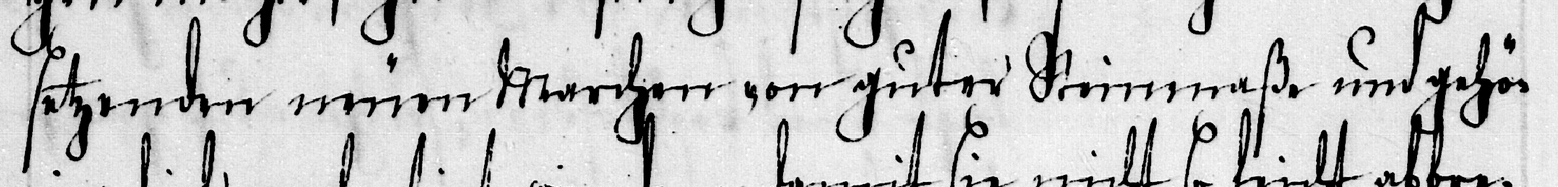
setzenden neuen Marchen von guter Steinmaße und gehö¬
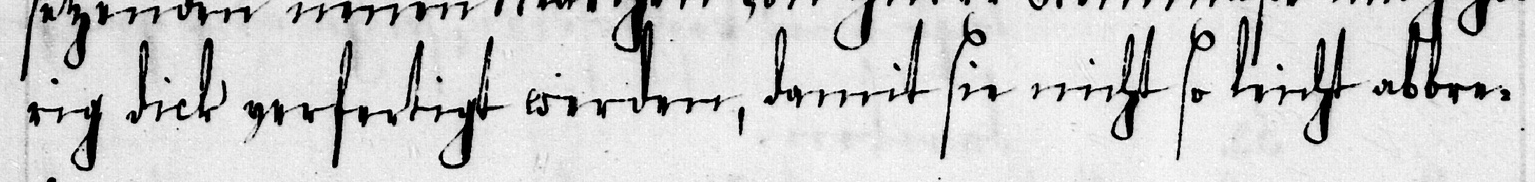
rig dick verfertigt werden, damit sie nicht so leicht abbre¬
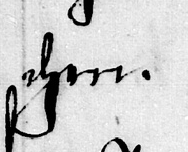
chen.
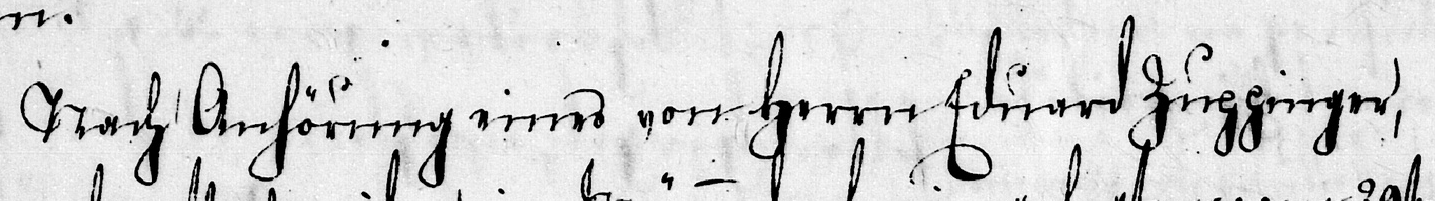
Nach Anhörung eines von Herrn Eduard Zuppinger,
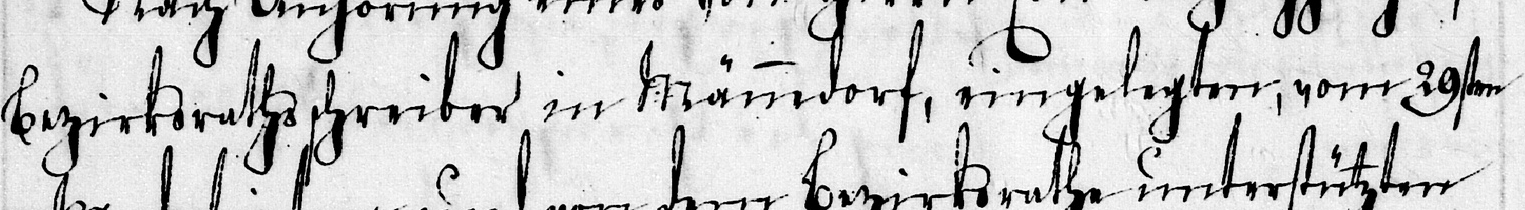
Bezirksrathsschreiber in Männedorf, eingelegten, vom 29ten
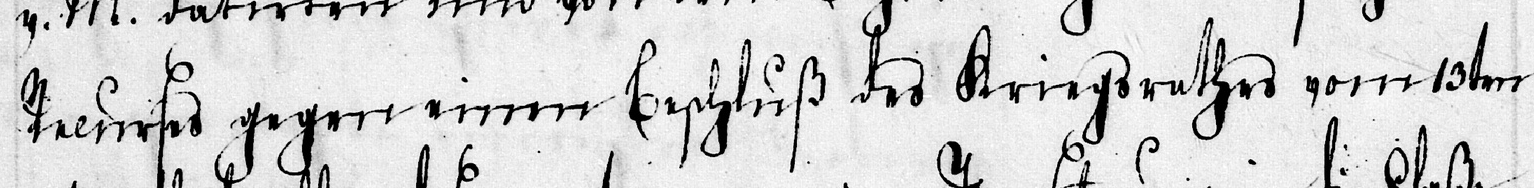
Recurses gegen einen Beschluß des Kriegsrathes vom 13ten
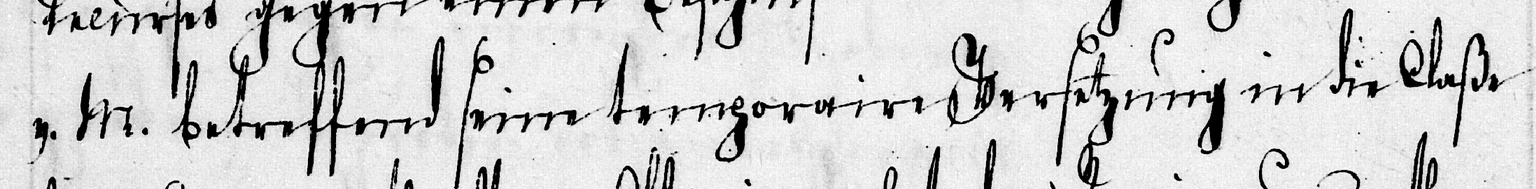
v. M. betreffend seine temporaire Versetzung in die Claße
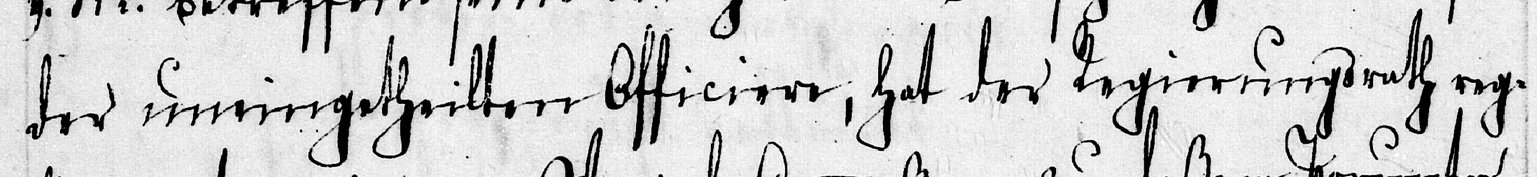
der uneingetheilten Officiere, hat der Regierungsrath reg¬
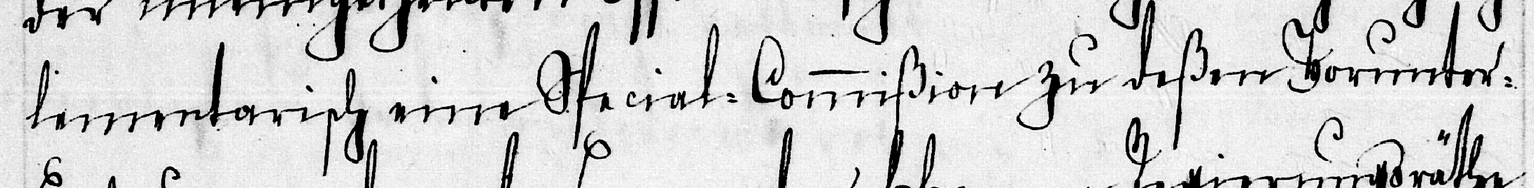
lementarisch eine Special-Commißion zu deßen Vorunter¬
